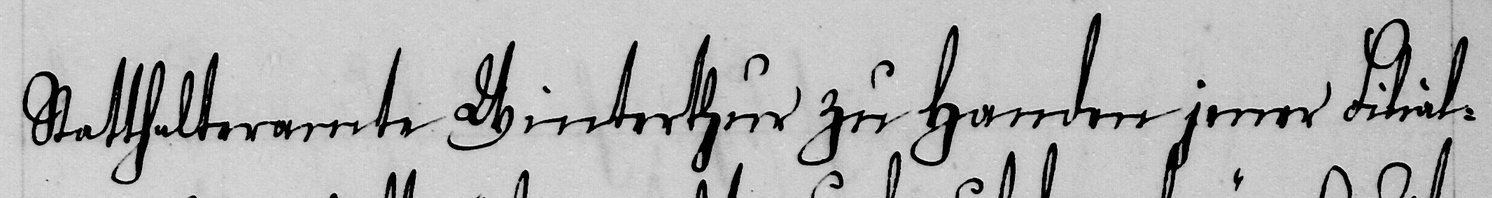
Statthalteramte Winterthur zu Handen jener Filial¬
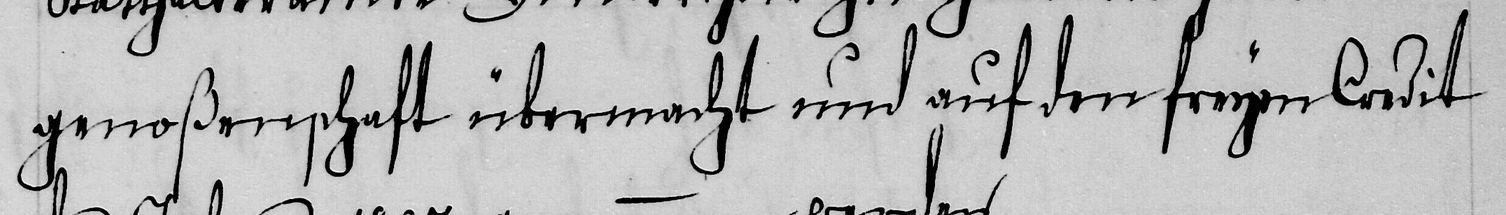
genoßenschaft übermacht und auf den freyen Credit
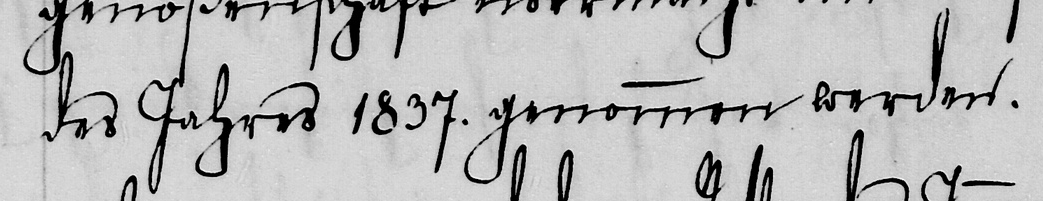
des Jahres 1837. genommen werden.
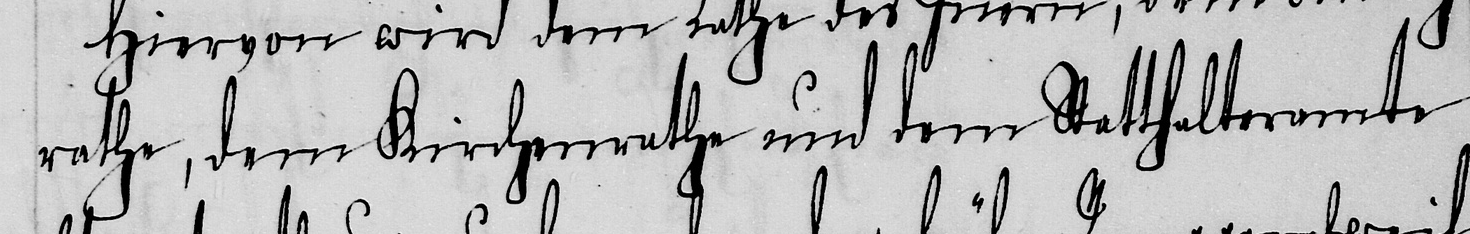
rathe, dem Kirchenrathe und dem Statthalteramte
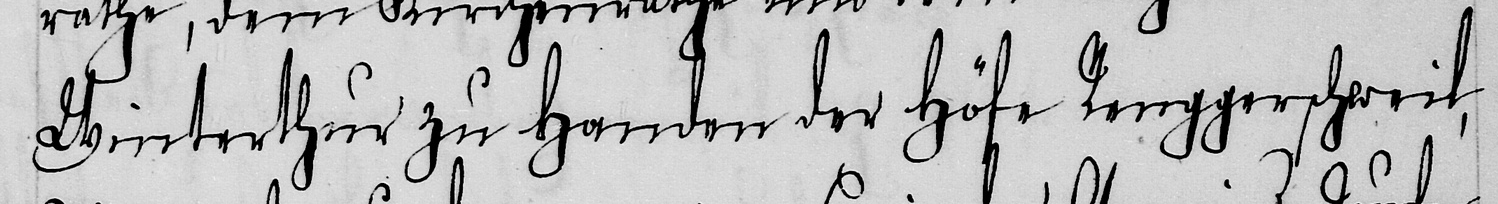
Winterthur zu Handen der Höfe Renggerschweil
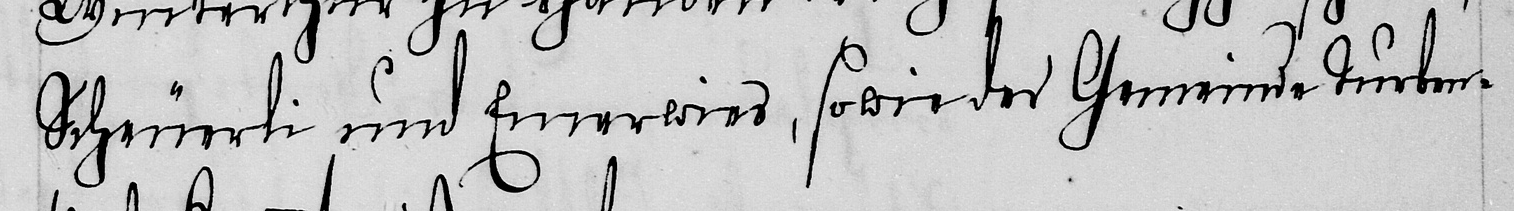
Scheuerli und Emerwies, sowie der Gemeinde Turben¬
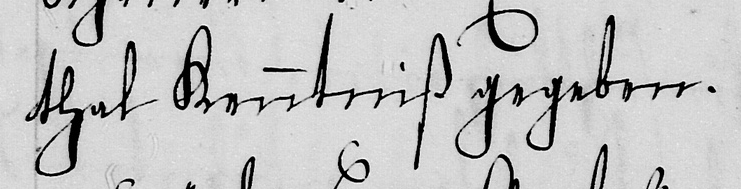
thal Kenntniß gegeben.
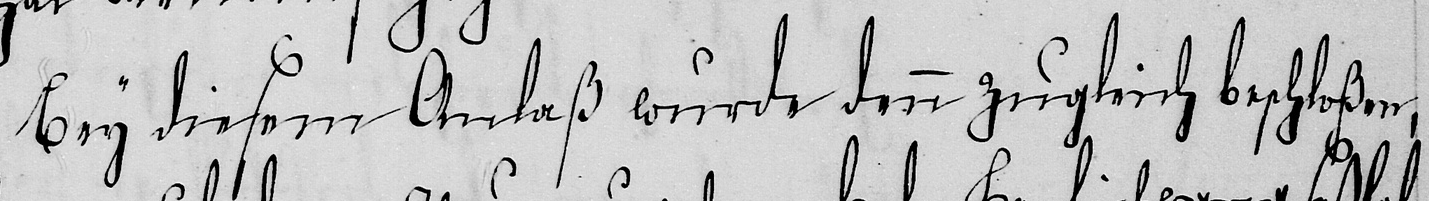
Bey diesem Anlaß wurde denn zugleich beschloße¬
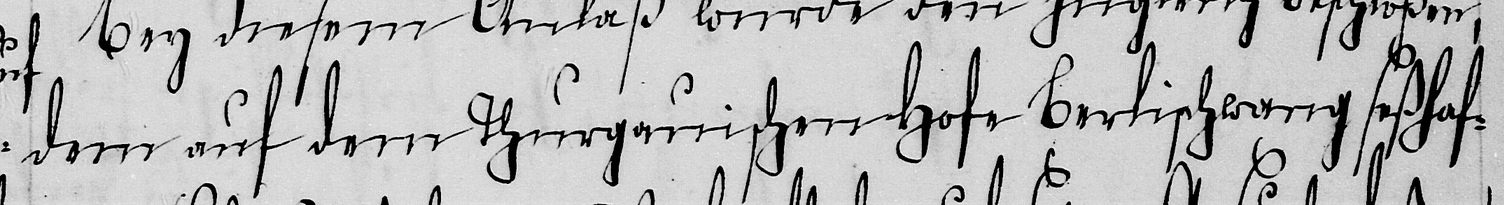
dem auf dem Thurgauischen Hofe Berlischwang seßha¬
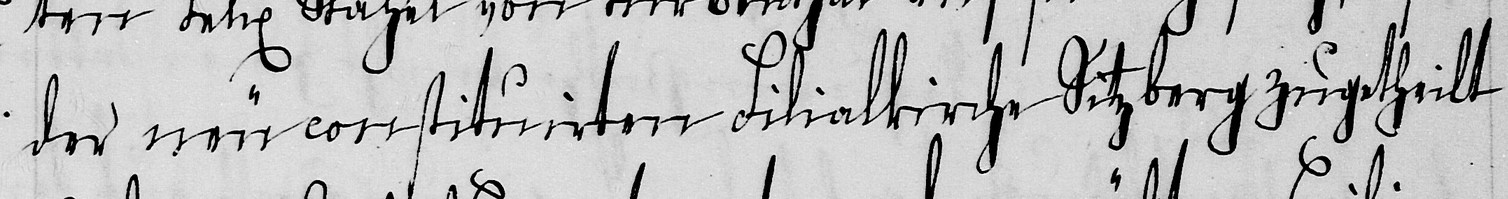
der neu constituirten Filialkirche Sitzberg zugetheilt
